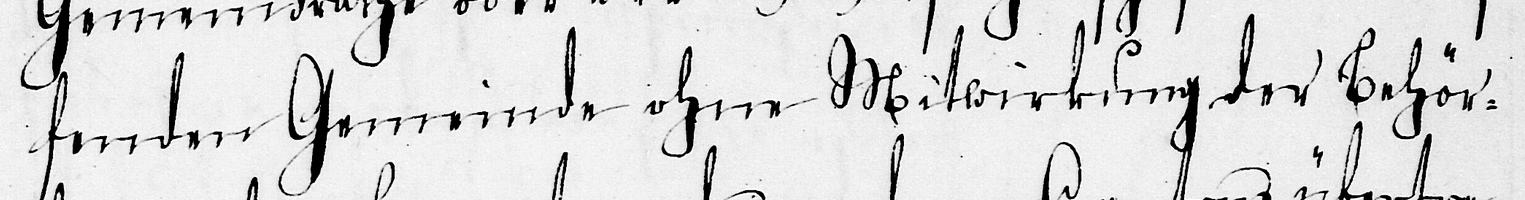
fenden Gemeinde ohne Mitwirkung der Behör¬
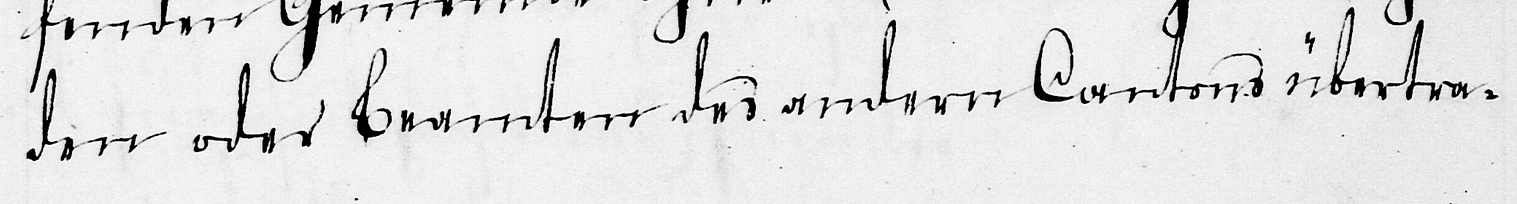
den oder Beamten des andern Cantons übertra¬
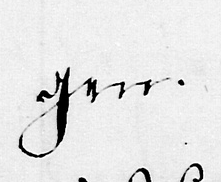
gen.
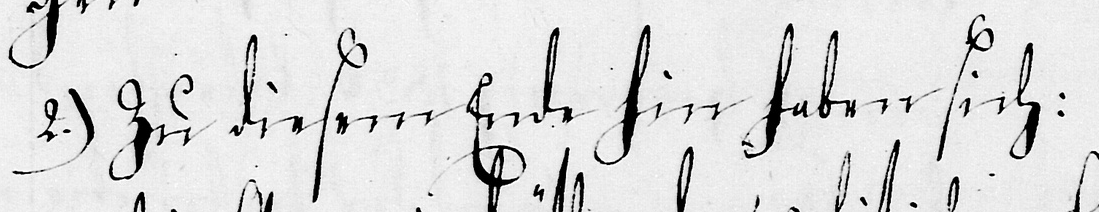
2.) Zu diesem Ende hin haben sich:
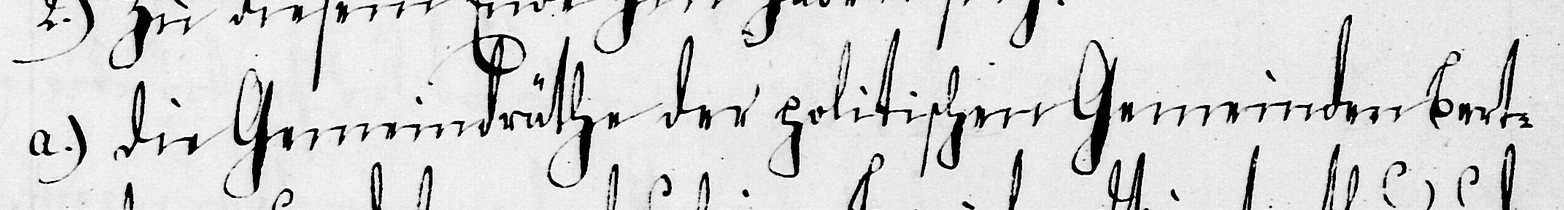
a.) Die Gemeindräthe der politischen Gemeinden Bert¬
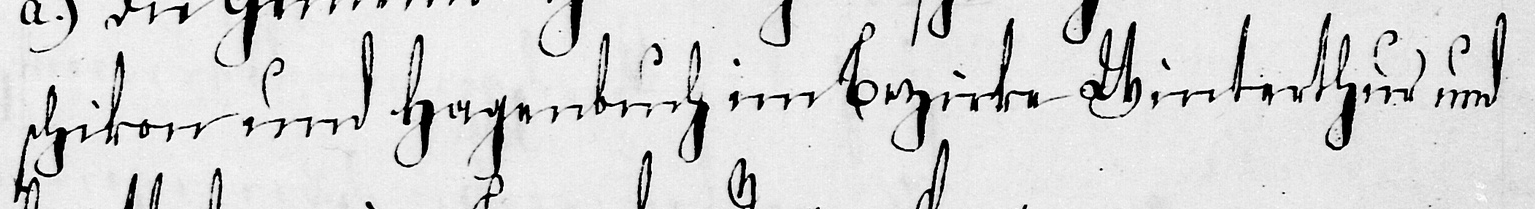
schikon und Hagenbuch im Bezirke Winterthur und
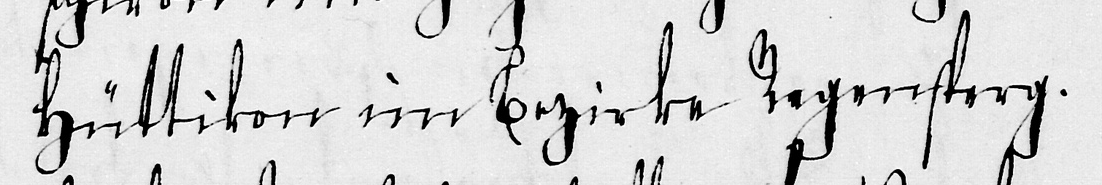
Hüttikon im Bezirke Regensberg.
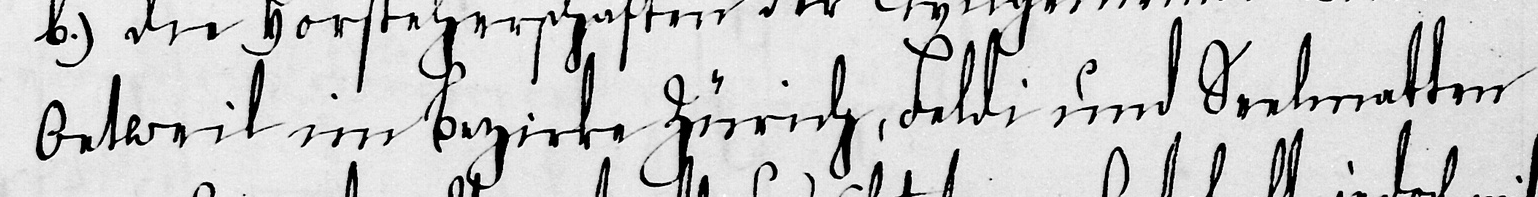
etweil im Bezirke Zürich, Feldi und Seelmatten
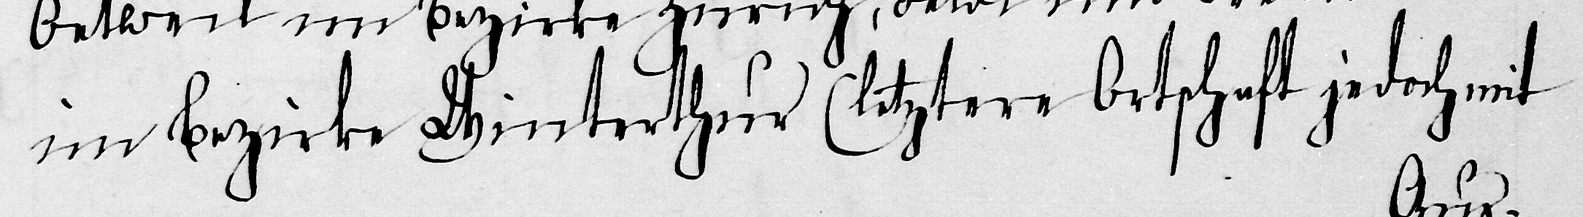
im Bezirke Winterthur (letztere Ortschaft jedoch mit
